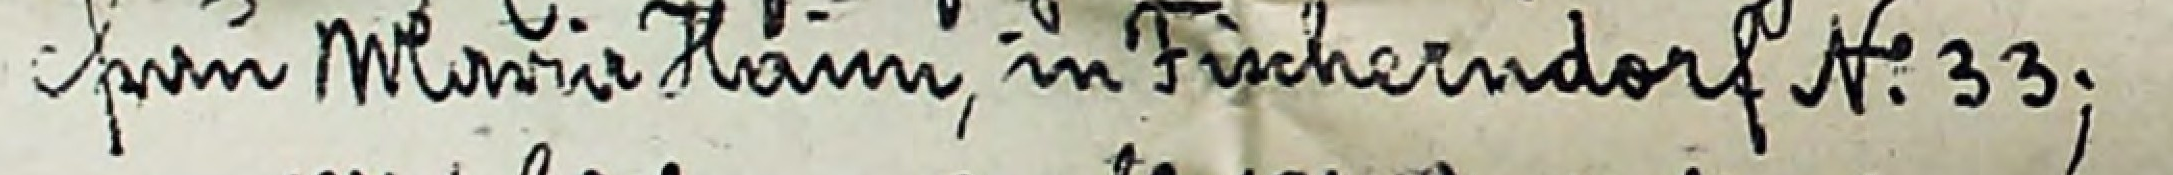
Frau Maria Haim, in Fischerndorf № 33;
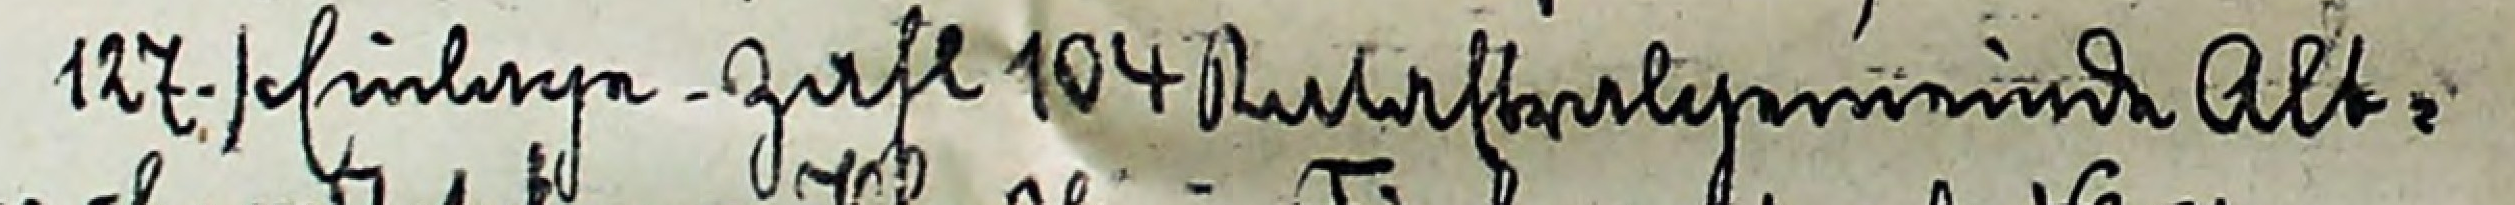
127.) Einlage - Zahl 104 Katastralgemeinde Alt=
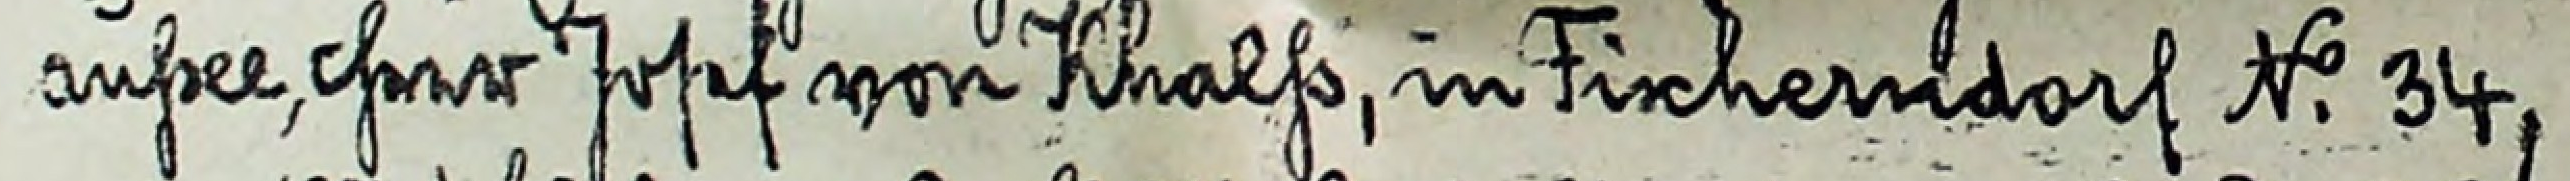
aussee, Herr Josef von Khalhs, in Fischerndorf № 34;
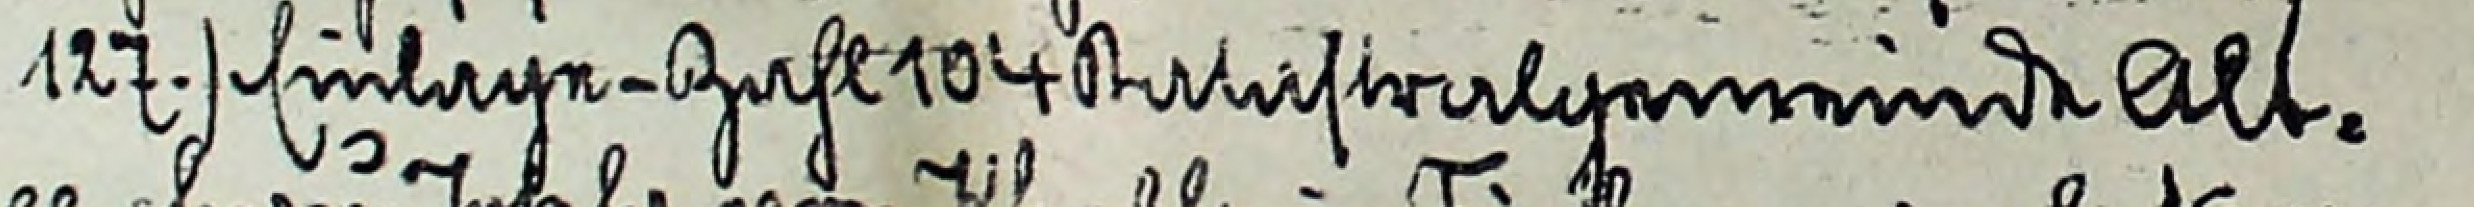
127.) Einlage - Zahl 104 Katastralgemeinde Alt=
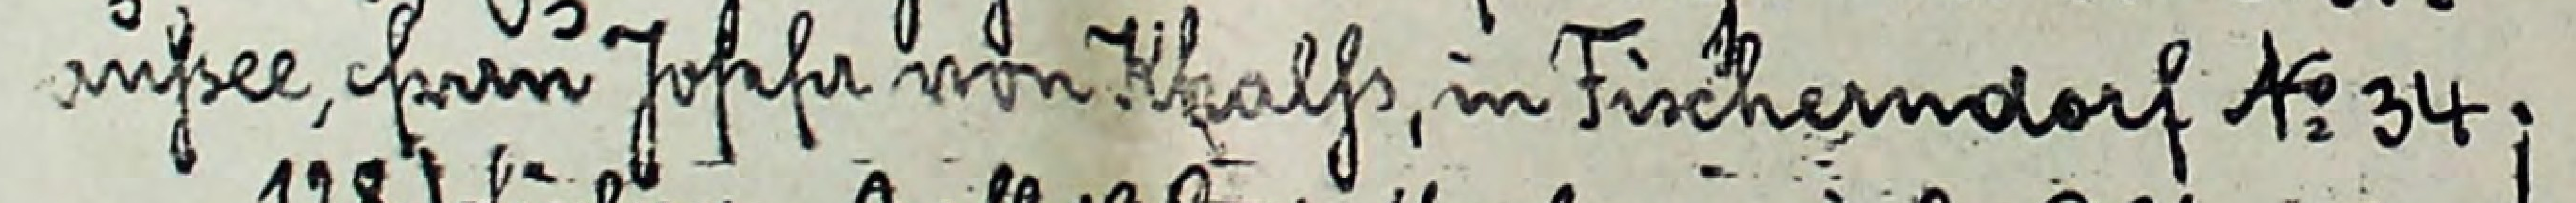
aussee, Frau Josefa von Khalhs, in Fischerndorf № 34;
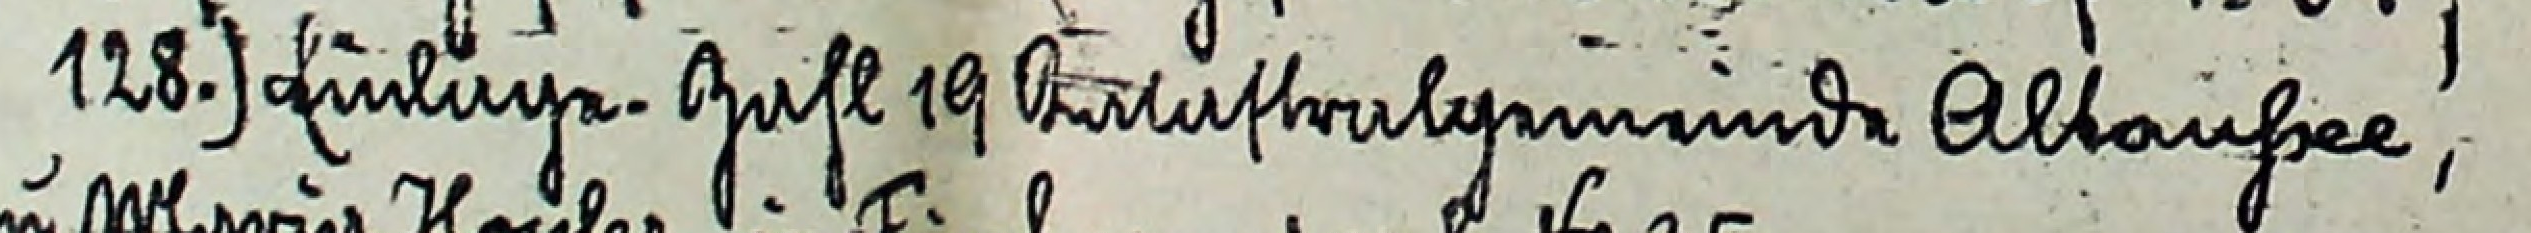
128.) Einlage - Zahl 19 Katastralgemeinde Altaussee,
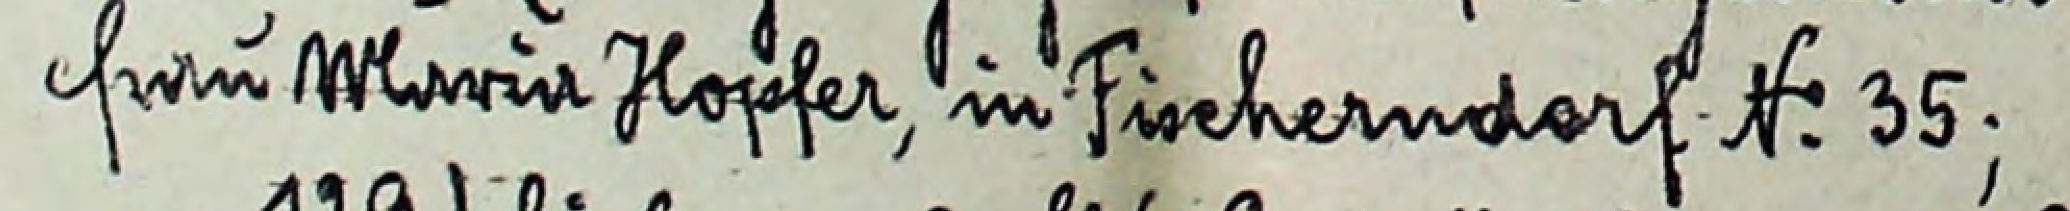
Frau Maria Hopfer, in Fischerndorf № 35;
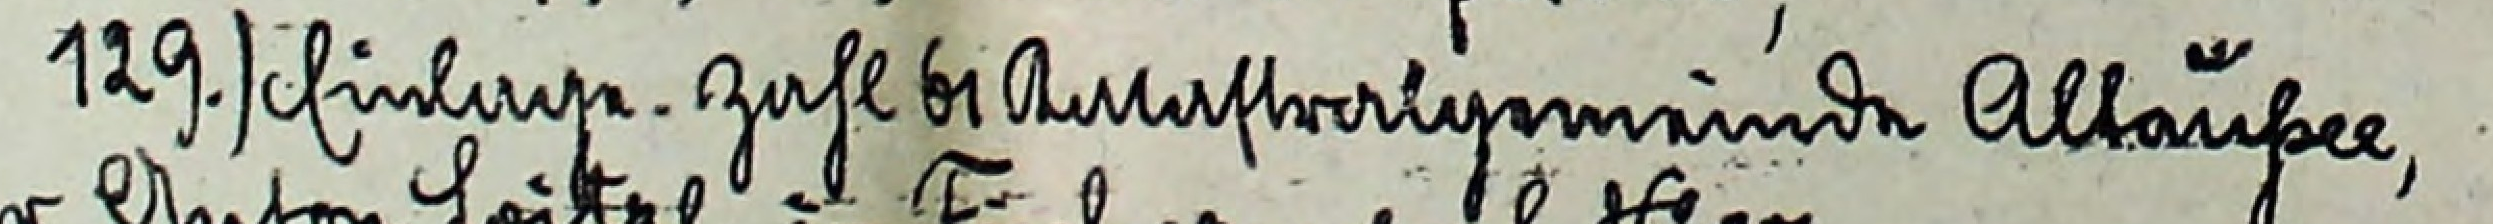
129.) Einlage - Zahl 61 Katastralgemeinde Altaussee,
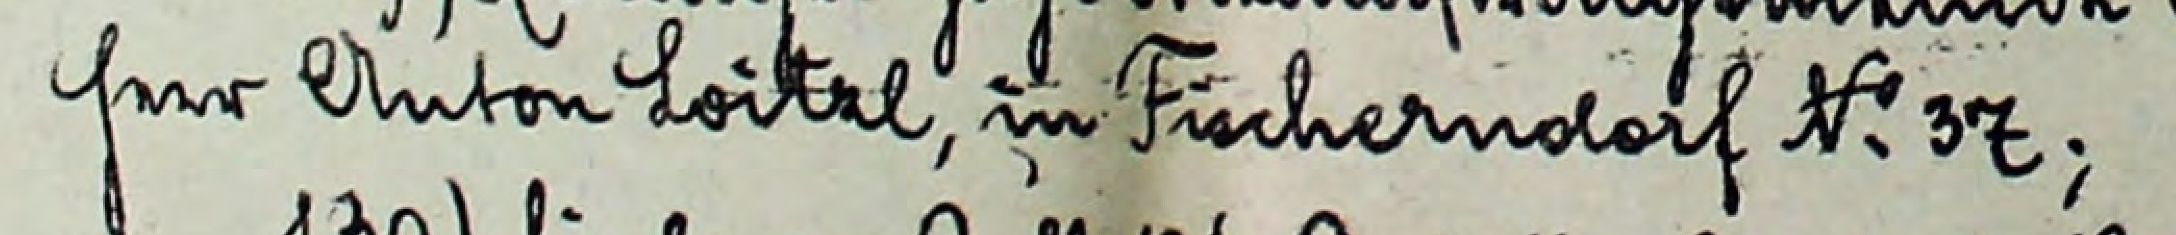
Herr Anton Loitzl, in Fischerndorf № 37;
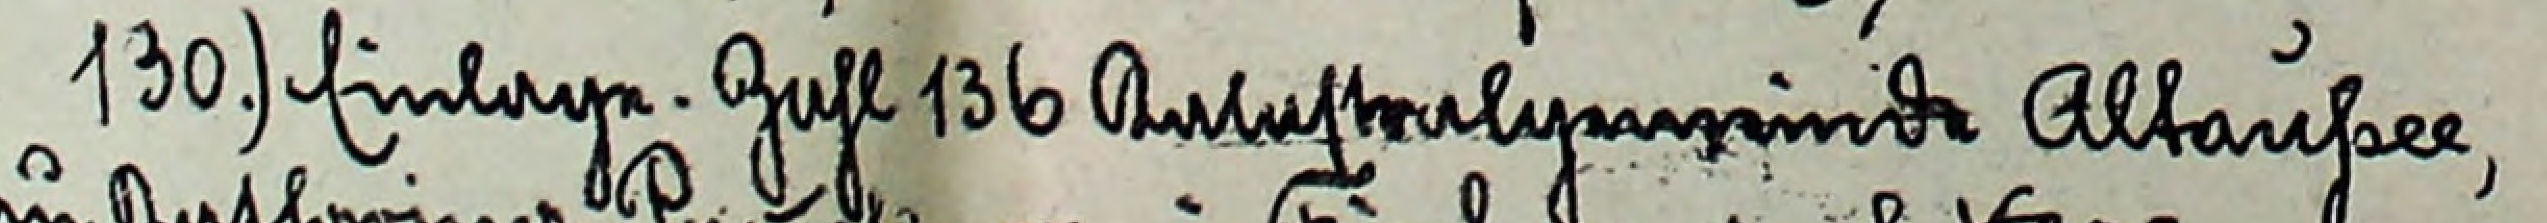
130.) Einlage - Zahl 136 Katastralgemeinde Altaussee,
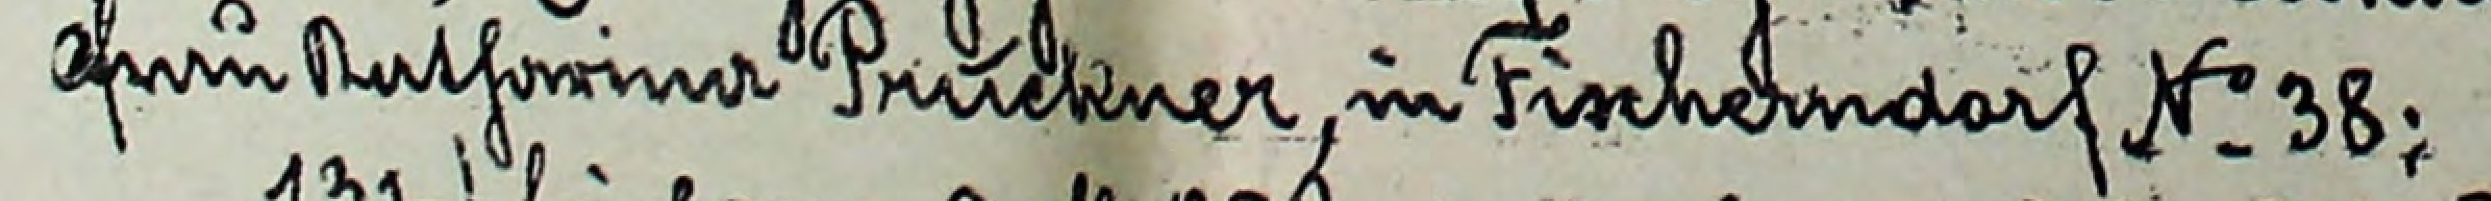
Frau Katharina Pruckner in Fischerndorf № 38;
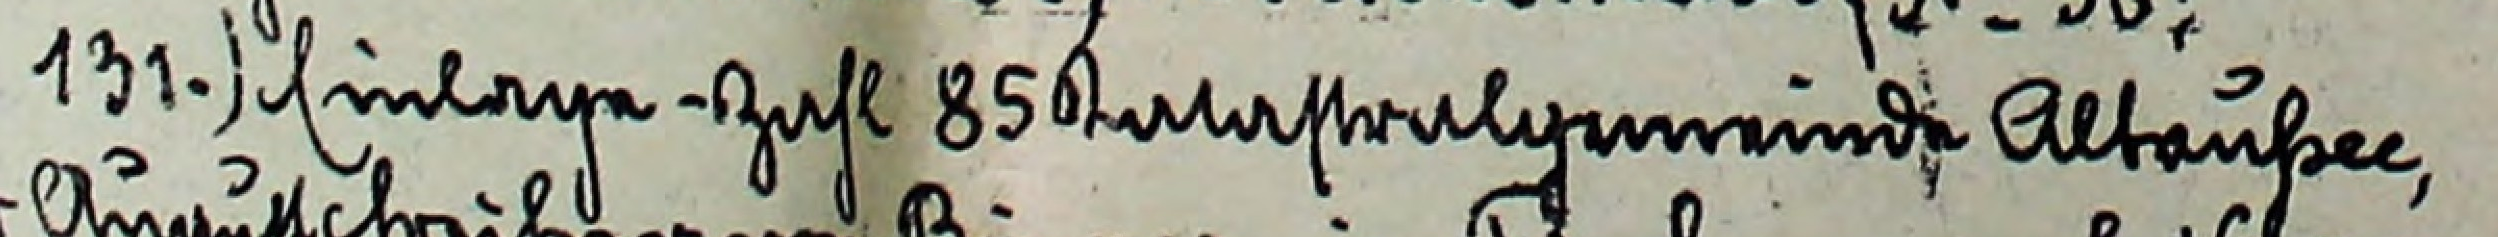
131.) Einlage - Zahl 85 Katastralgemeinde Altaussee,
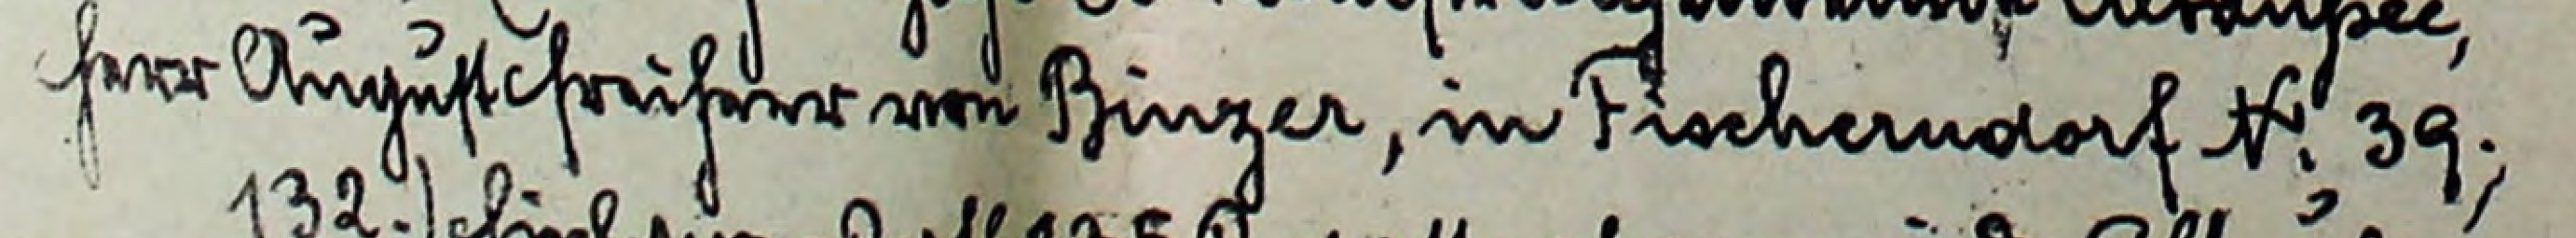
Herr August Freiherr von Binzer, in Fischerndorf № 39;
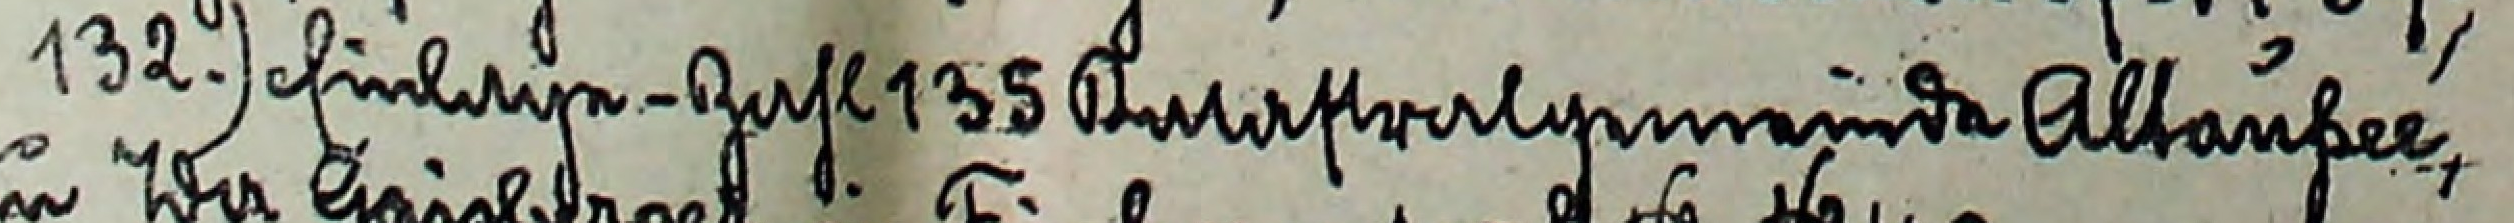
132.) Einlage - Zahl 135 Katastralgemeinde Altaussee,
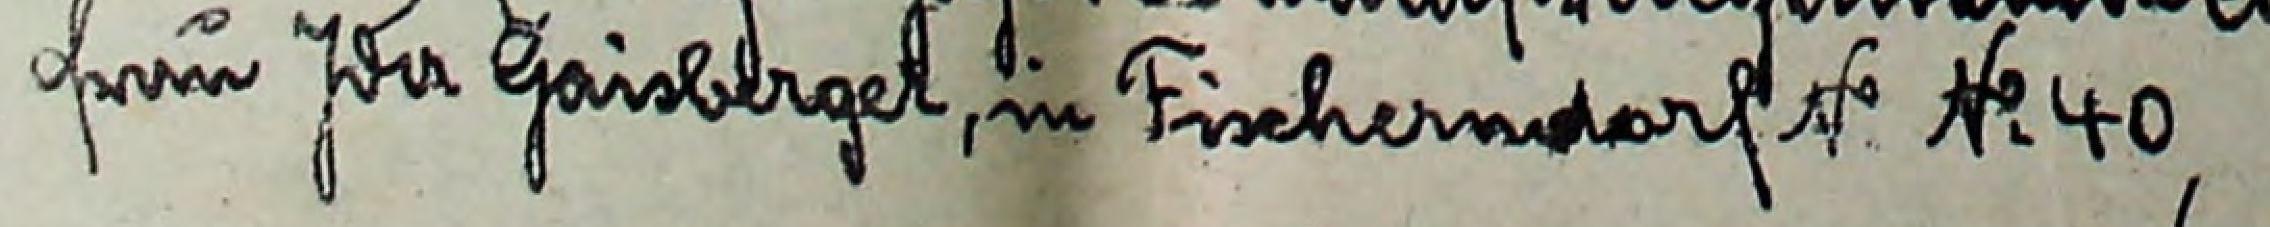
Frau Ida Gaisberger, in Fischerndorf № № 40,
